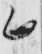㠯
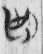○（廷）
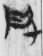阩
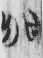門
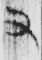又（有）
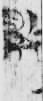敗
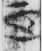正
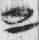旦
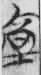塙
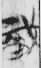戠
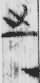之
